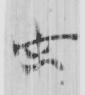才
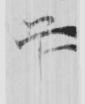下
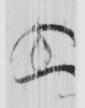立
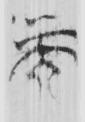而
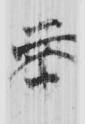不
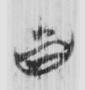由
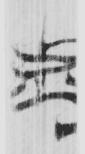者
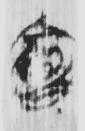{俞日}
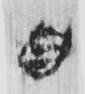自
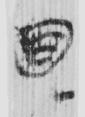固
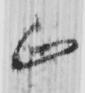㠯（以）
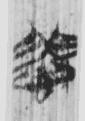悲
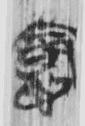{命心}
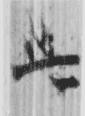之
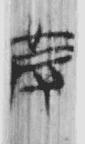皮
